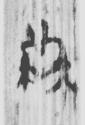{冉廿}
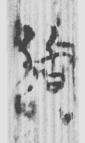{旨力}
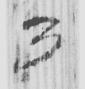乃
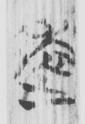遠
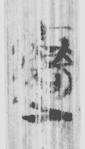{辶口甹}
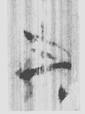之
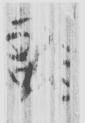{言䖵}
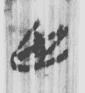臣
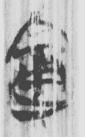{宀帝止}
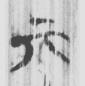亓
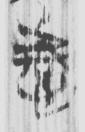{真心}
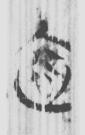裕
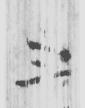之
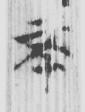不
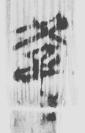韋
